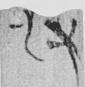{它攴}（施）
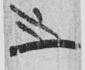之
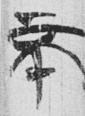不
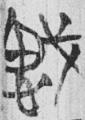{鬼戈}（威）
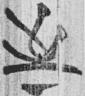至
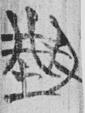型（刑）
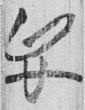㠯（以）
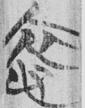○（哀）
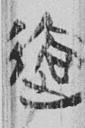迲（去）
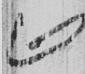㠯（以）
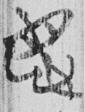○（謀）
